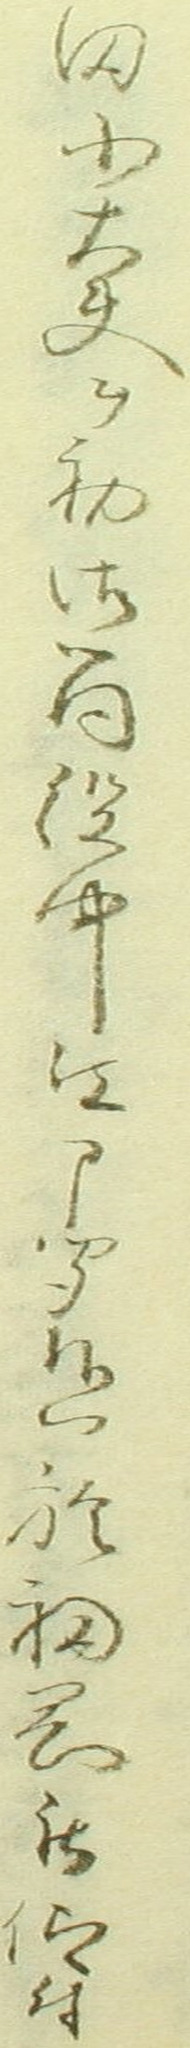田小太夫を初御筒役中江申聞候は於福岡被仰付
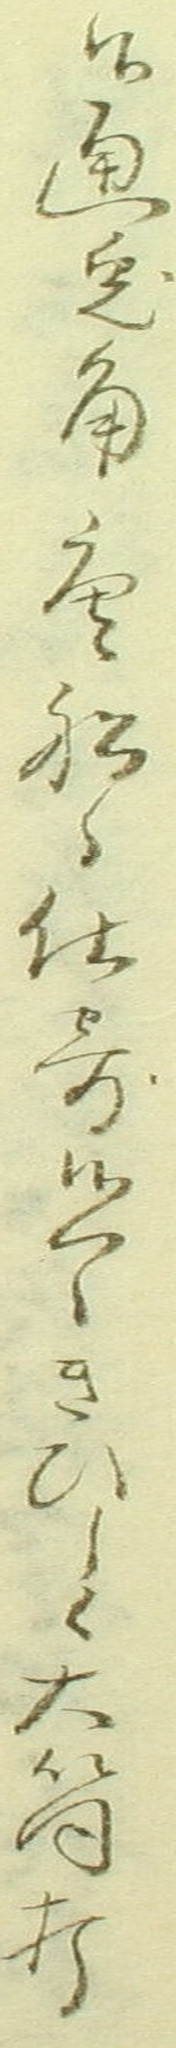候通兎角唐船之仕寄候ははきひしく大筒打
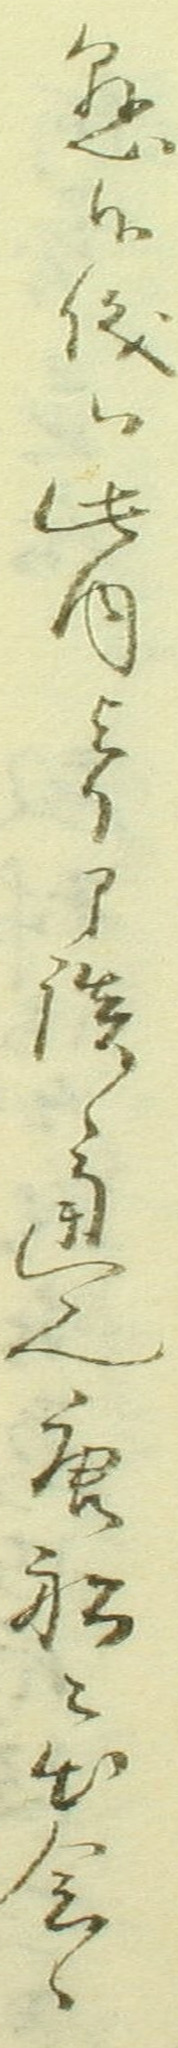懸候儀は此内より申請候通也唐船に出合候
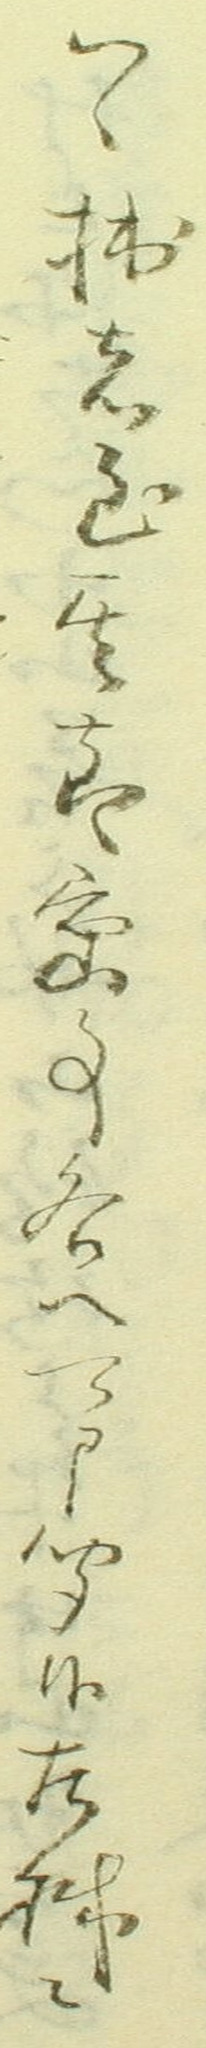はは拙者至其起密事各へ申聞候左様に
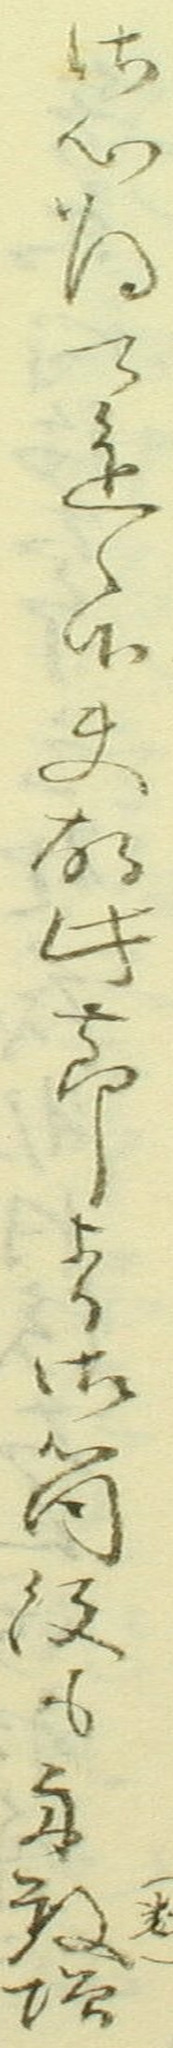御心得可達之候夫故此節御筒役も身数増
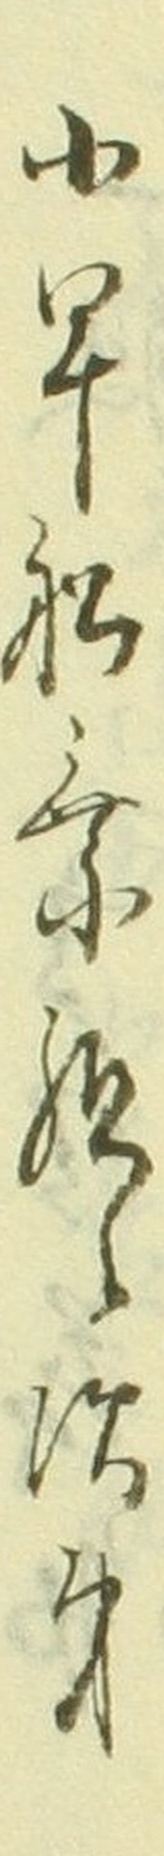小早船乗組候次第
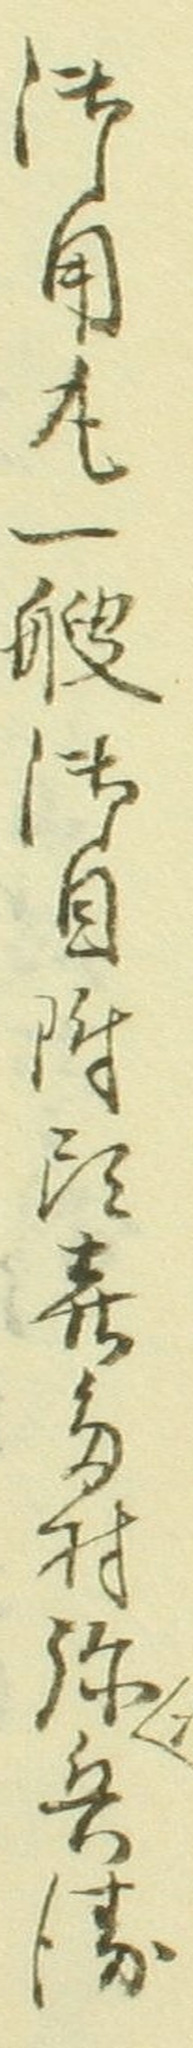御用丸一艘御目附喜多村弥次兵衛
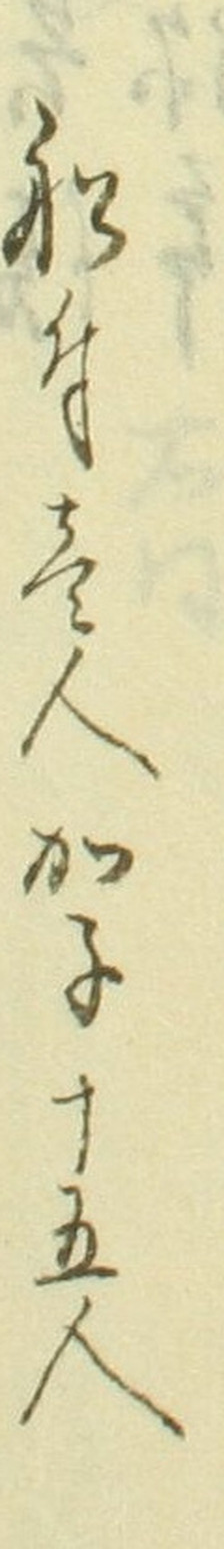船付壱人加子十五人
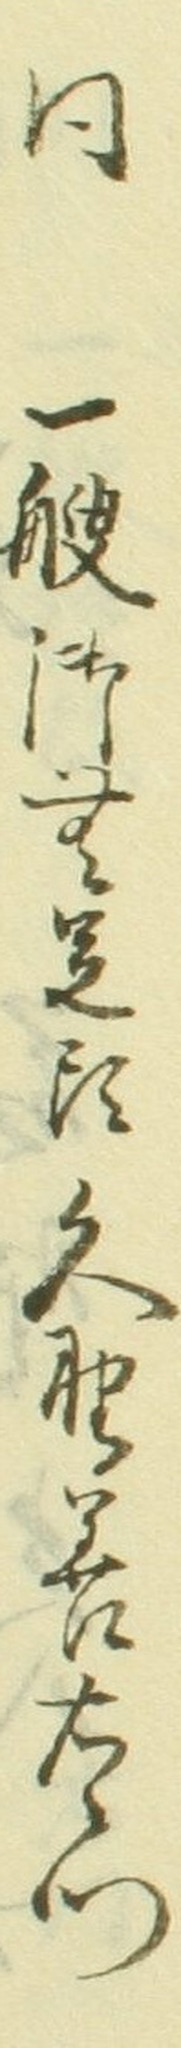同一艘御無足頭久野善右衛門右同
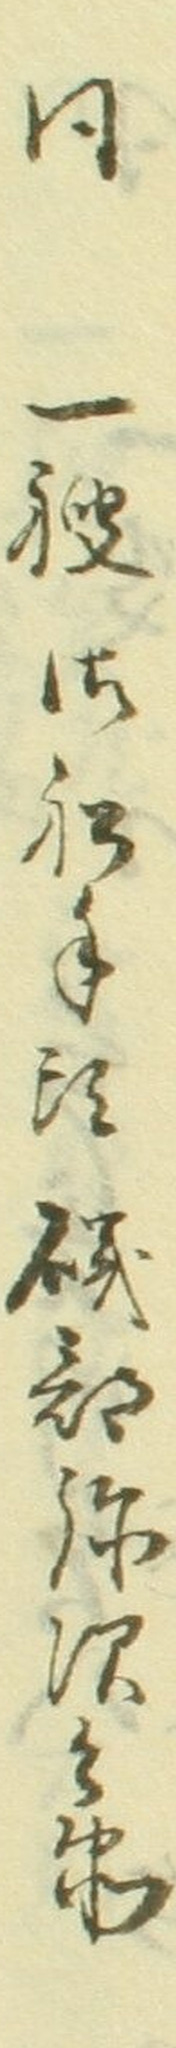同一艘御船手頭磯部弥次兵衛右同
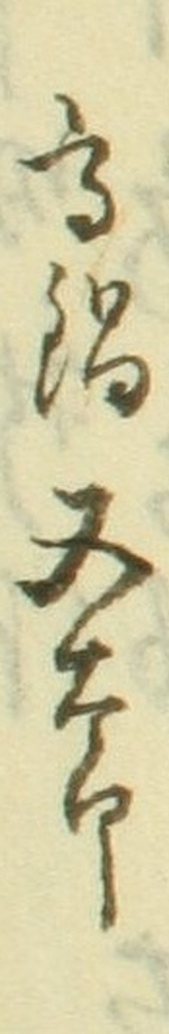高隅又太郎
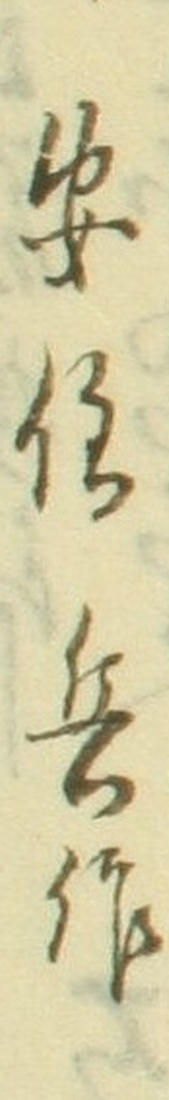安住兵作

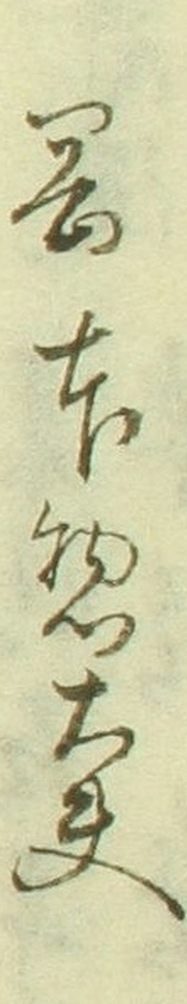岡本惣太夫
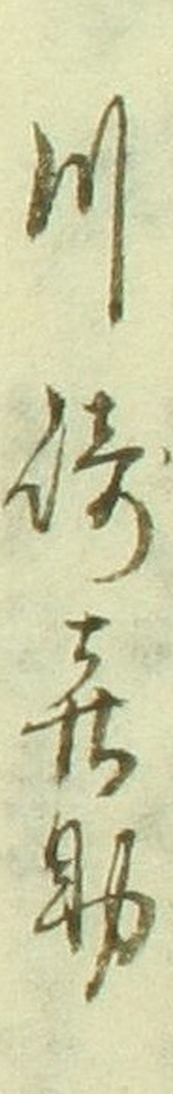川崎喜助
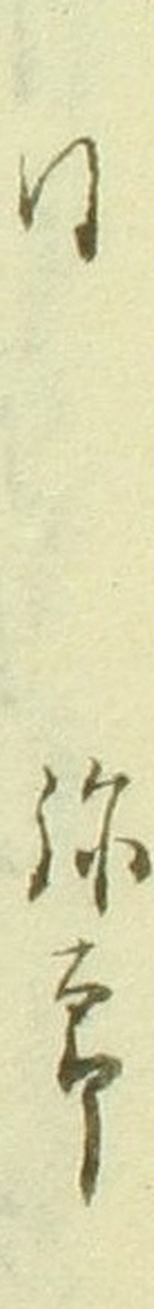同弥市
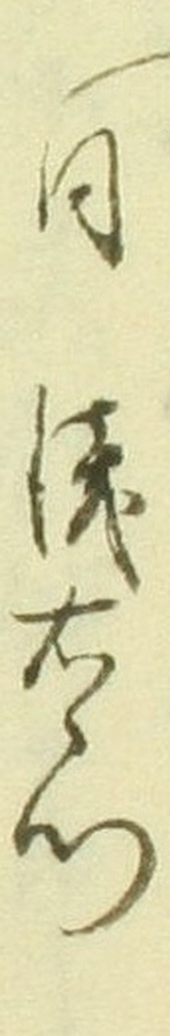同儀右衛門
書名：唐船漂流記 四
